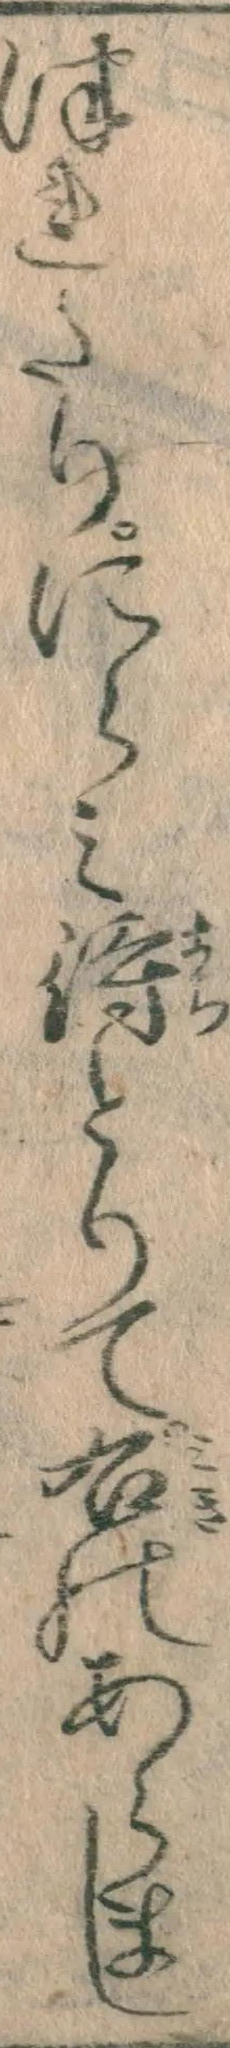つれたり。にらみ待とりて右のあらまし
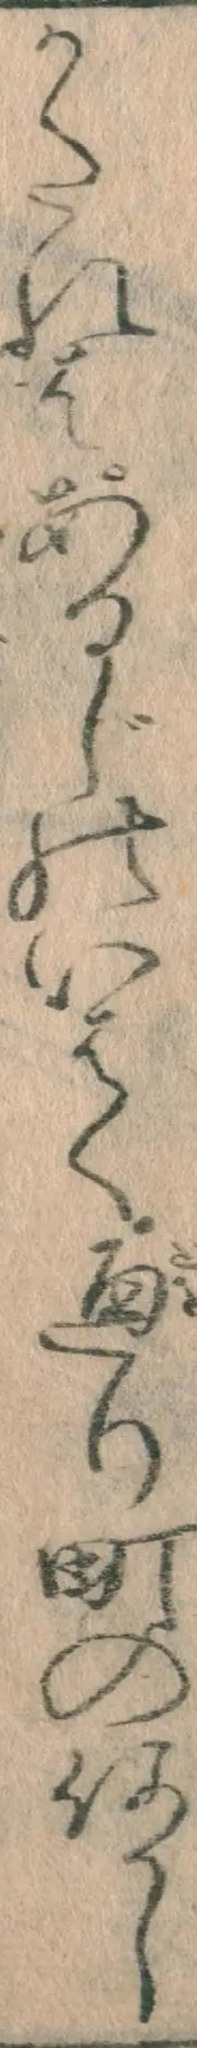かたれは。あるじのいはく、通り町の何かし
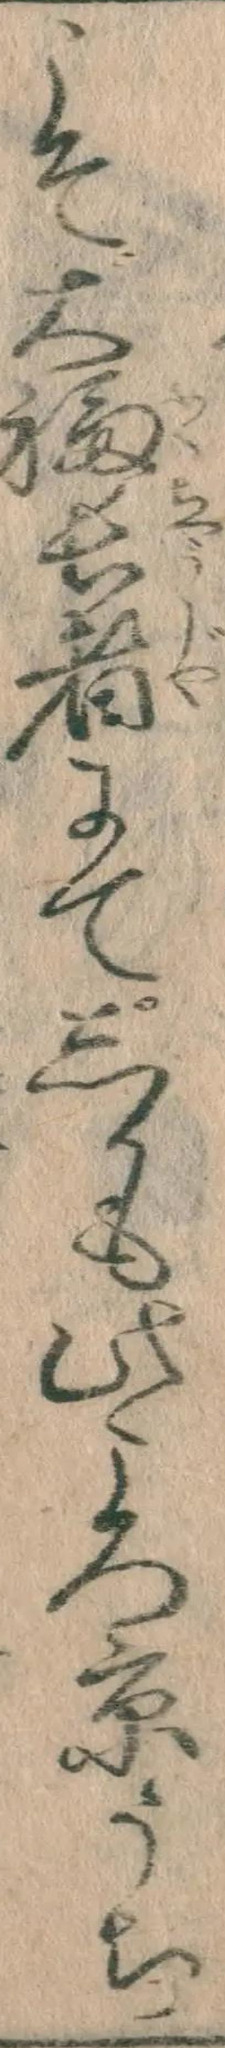こそ大福長者にて。しかも此ころ京うち
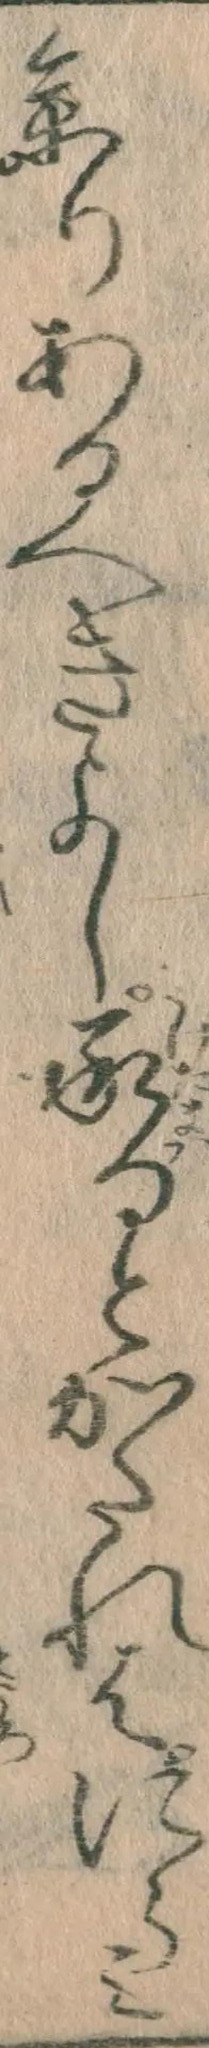参りあるへきよし。承るとかたれは。にらみ
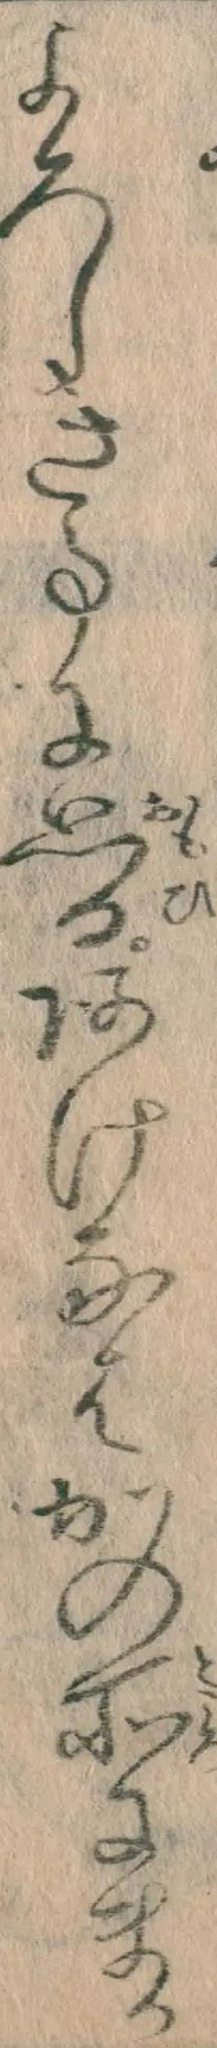よろしき事に思ひ。あけなはかの所にまか
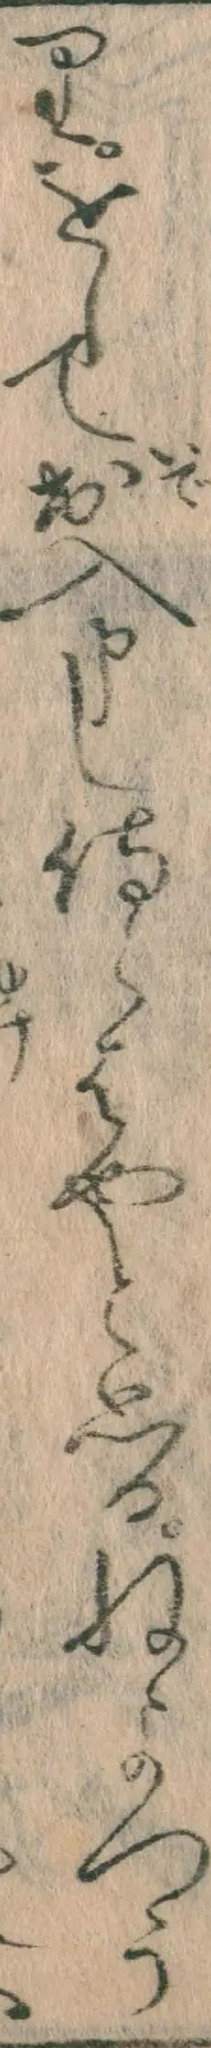り。をして出入申し侍らはやと思ひ。ねよつう
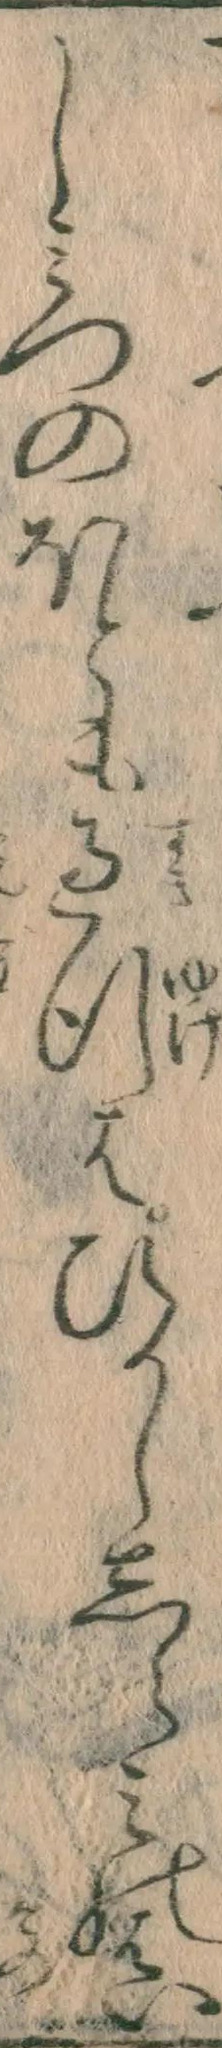しみつのほとも過行はひかししらみのはい
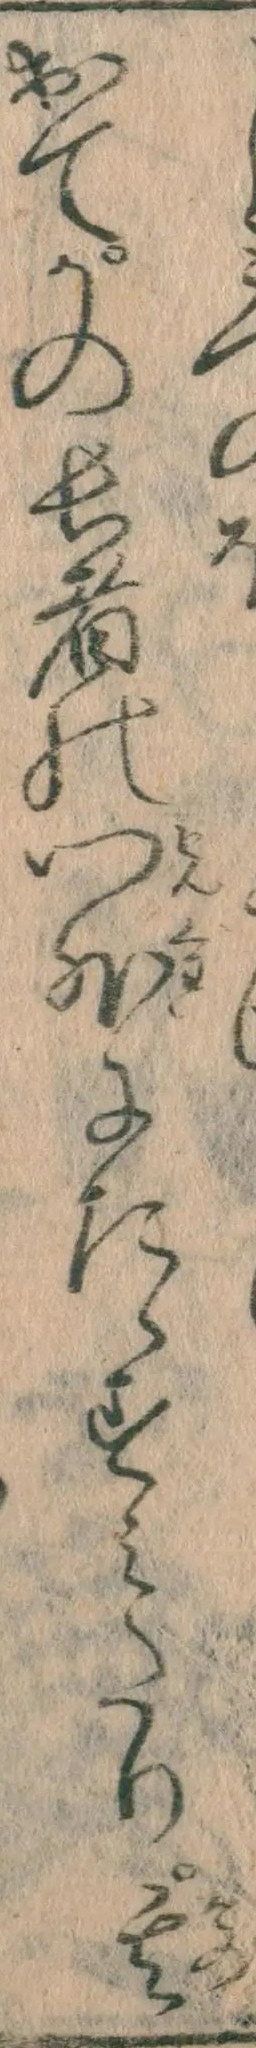出て。かの長者の門外にたゝすみたり。其
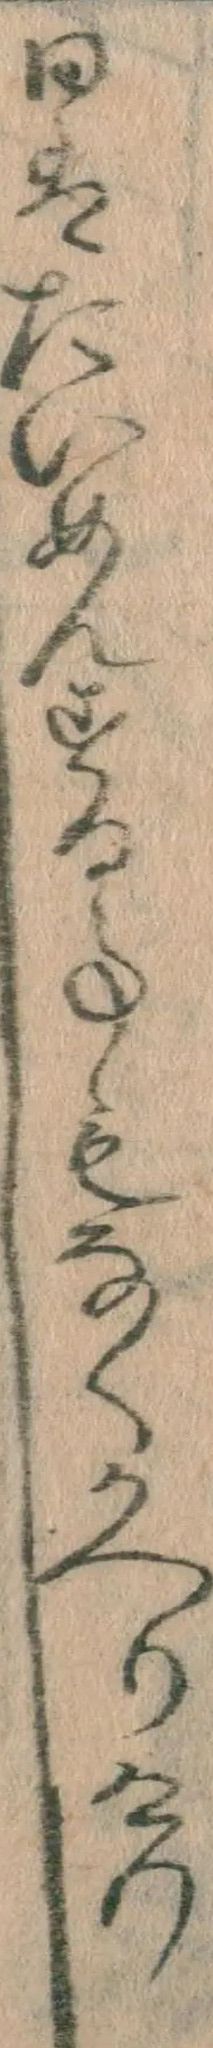日はたいめんする事もなくかへりけり
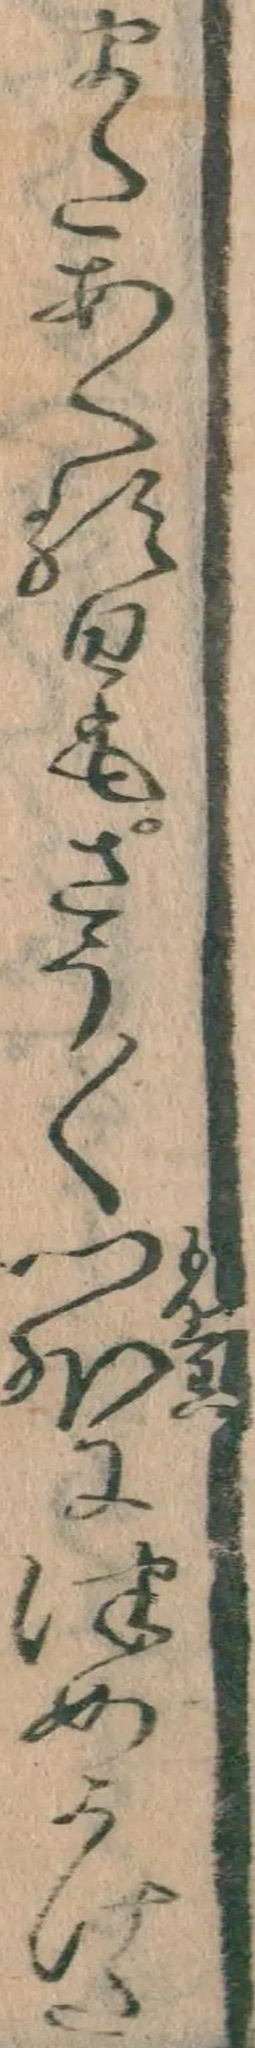またあくる日も。さう〳〵門外につめかけた
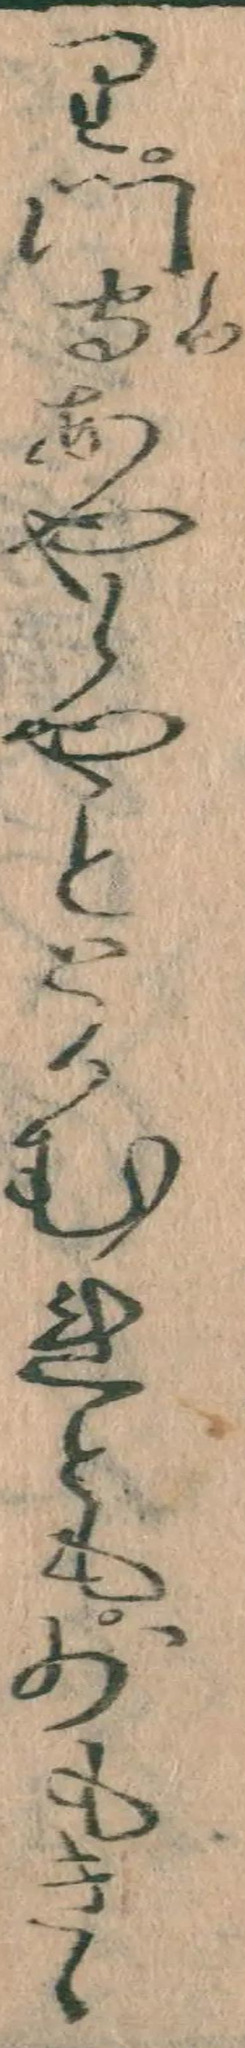り。門守あやしやととかむれとも。少もきゝ
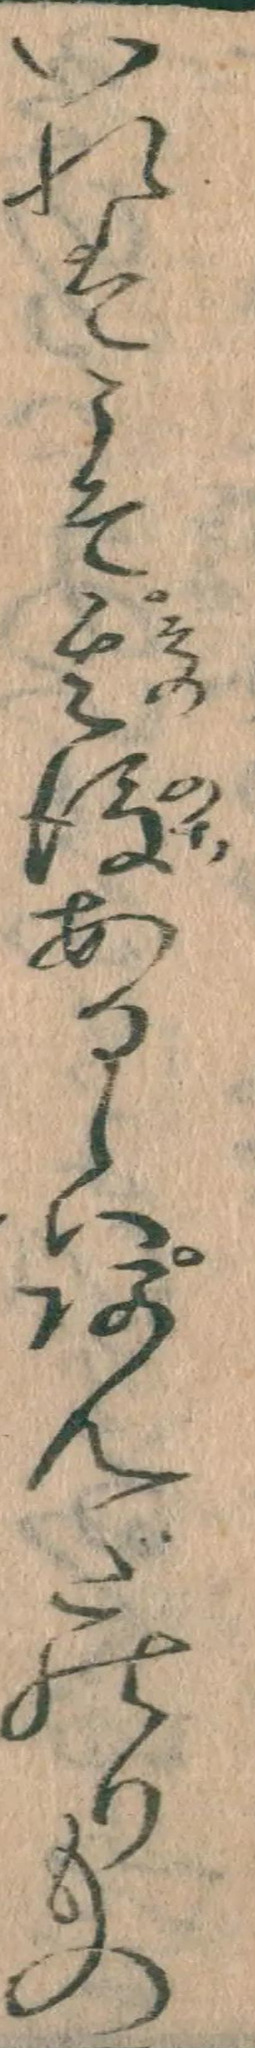いれはこそ。其後あるしは。あんだのりもの
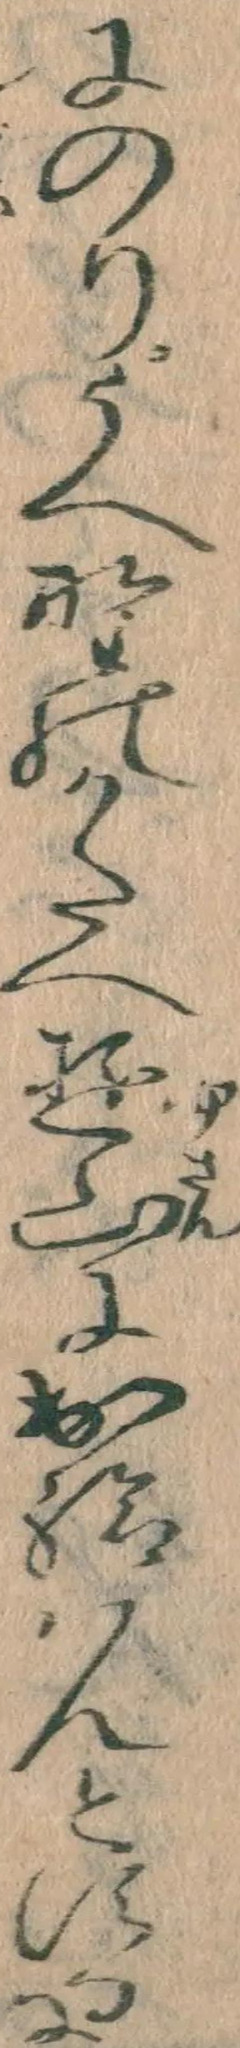にのり。うへ野のかたへ遊山に出給はんとするに
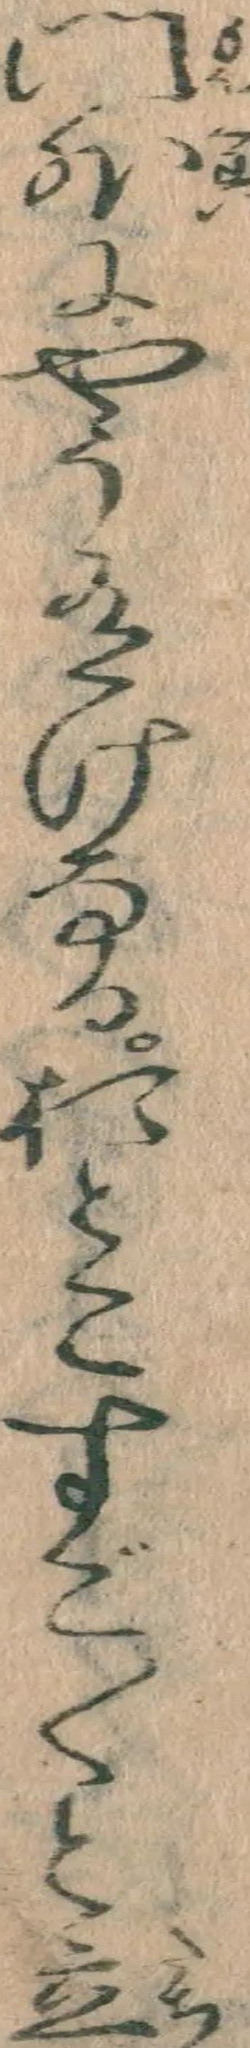門外にやう有けなる。おとこすご〳〵と立
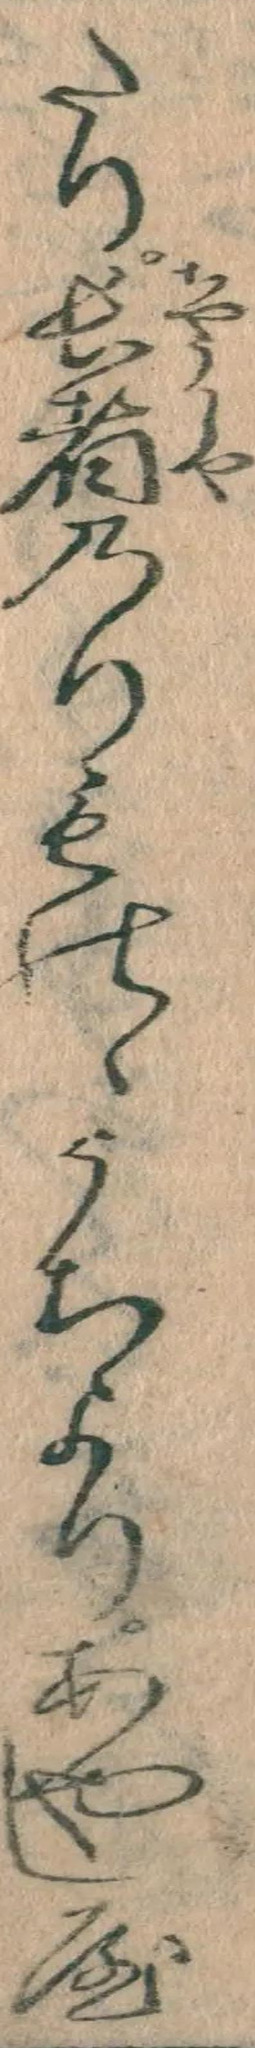たり。長者のりものゝうちより。あやしや
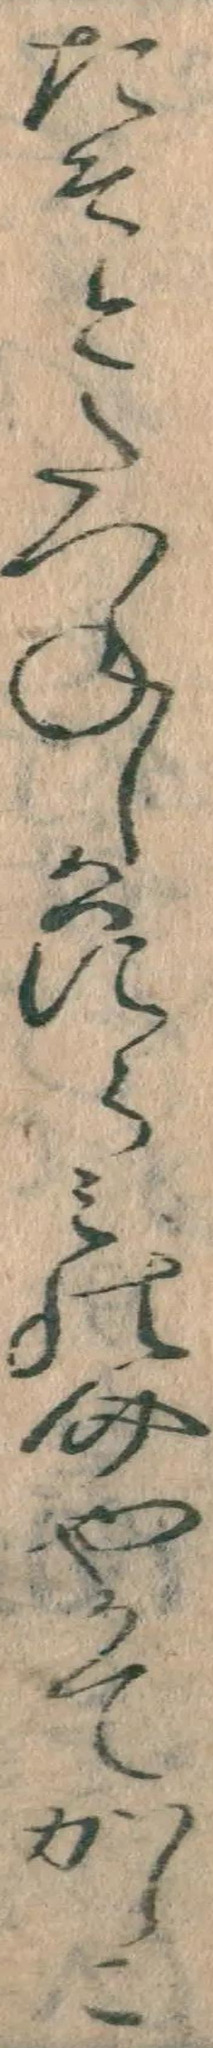たそとたつねしかはにらみの介やかてかしこ
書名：竹斎狂歌物語 3巻
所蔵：国立国会図書館 National Diet Library, JAPAN
